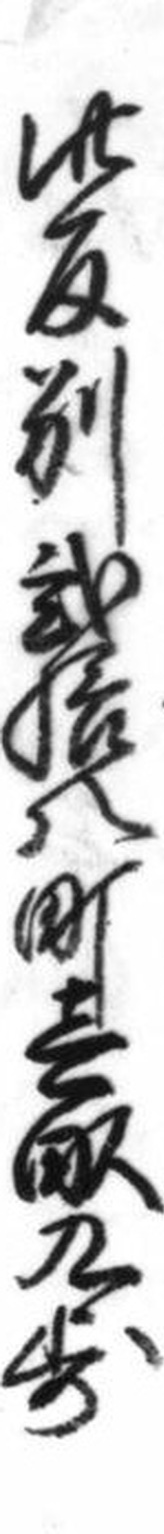此反別弐拾八町壱畝九歩
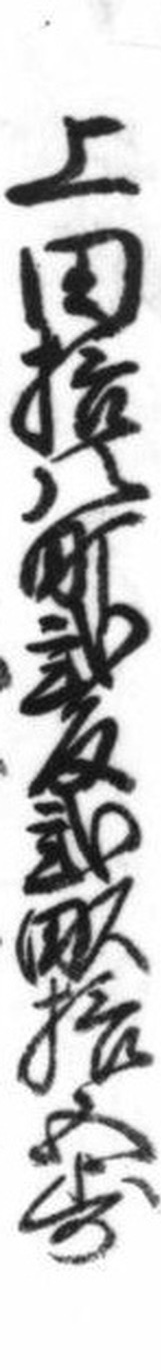上田拾八町弐反弐畝拾五歩
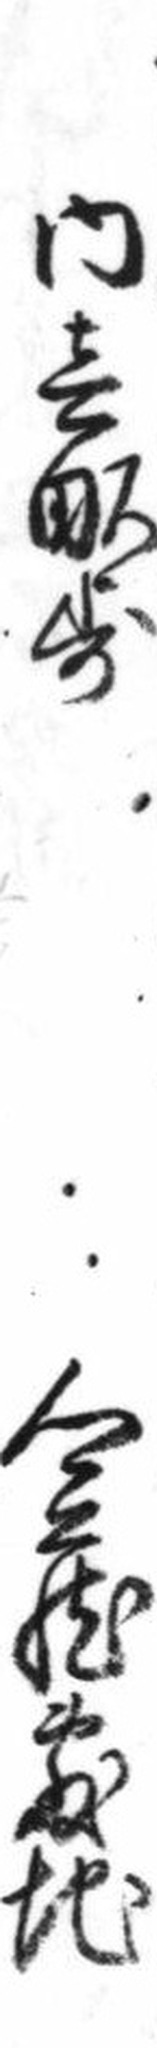内壱畝歩郷蔵敷地
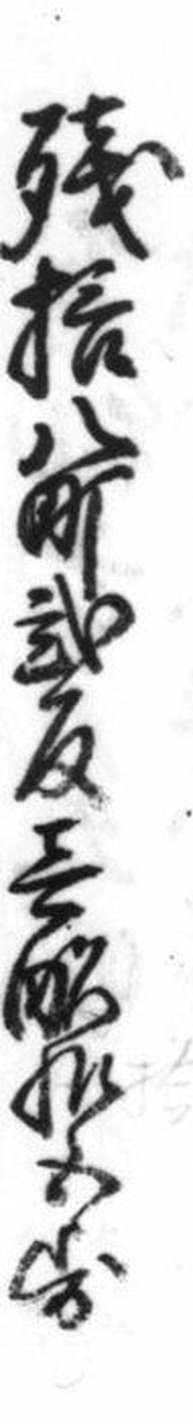上田拾八町弐反弐畝拾五歩
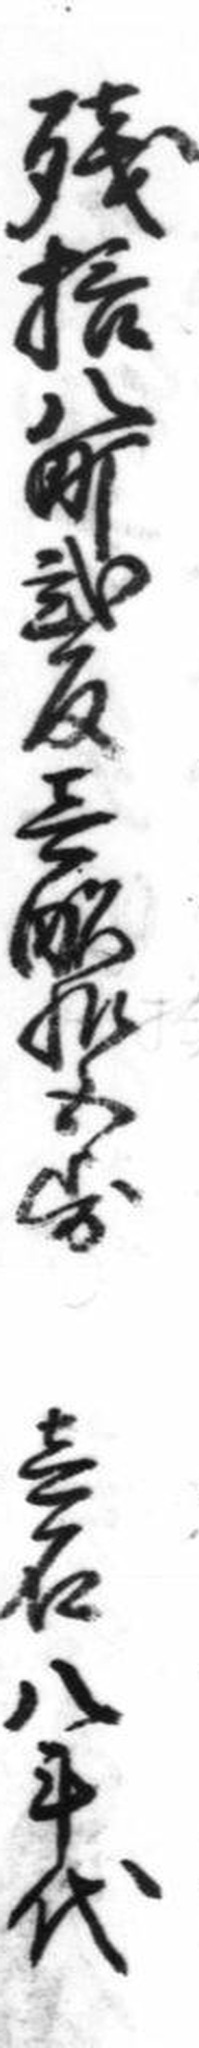残拾八町弐反壱畝拾五歩壱石八斗代
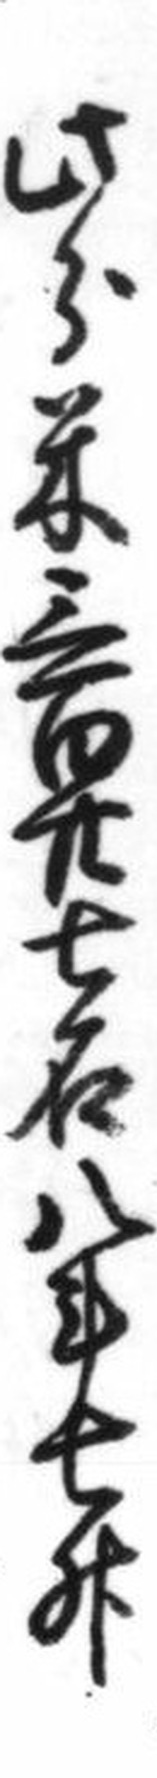此分米三百廿七石八斗七升
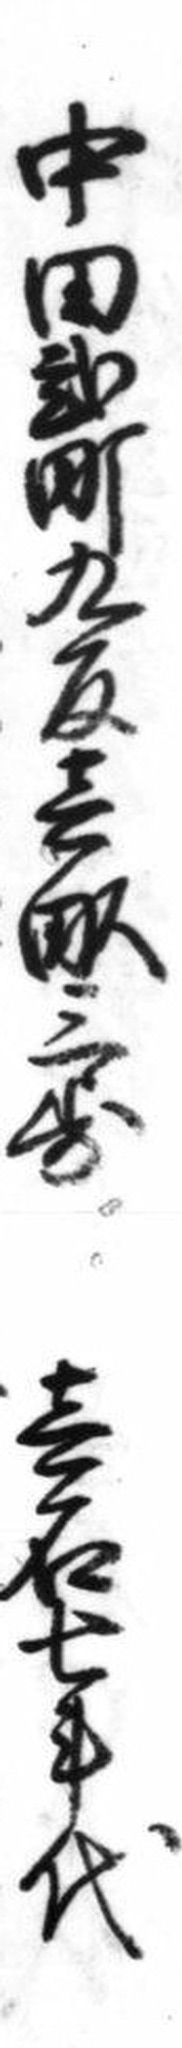中田弐町九反壱畝三歩壱石七斗代
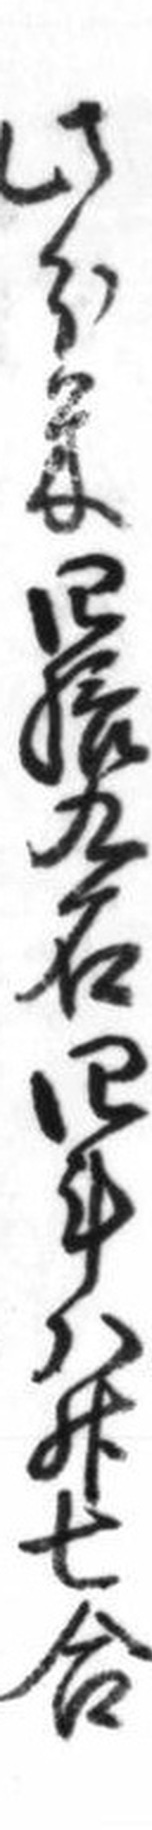此分米四拾九石四斗八升七合
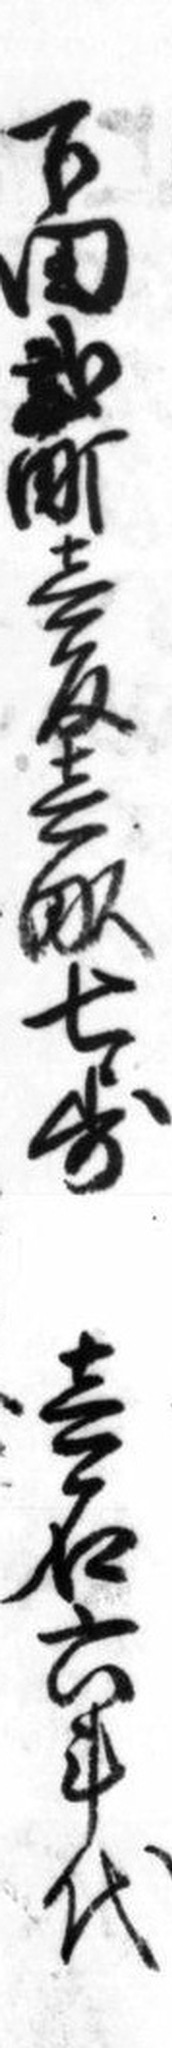下田弐町壱反壱畝七歩壱石六斗代
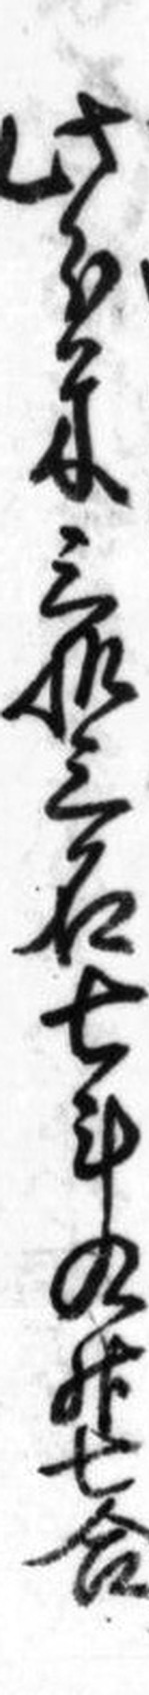此分米三拾三石七斗九升七合

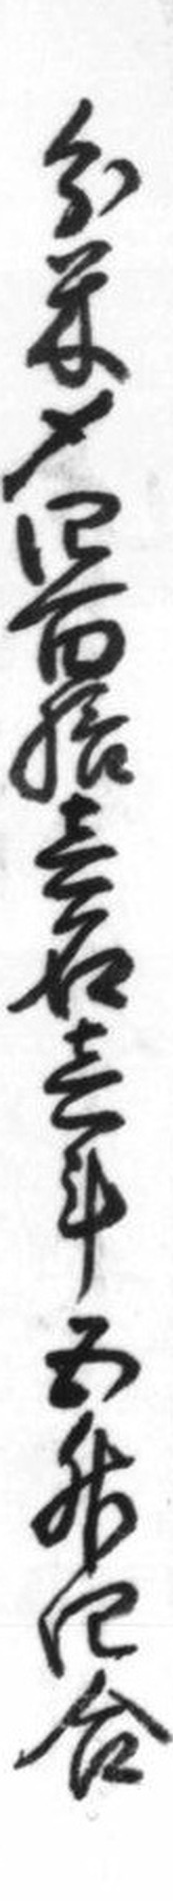分米〆四百拾壱石壱斗五升四合
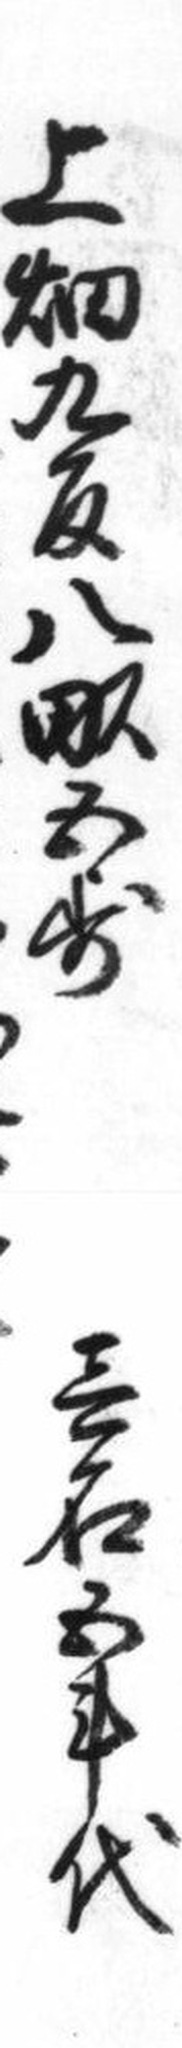上畑九反八畝五歩壱石五斗代
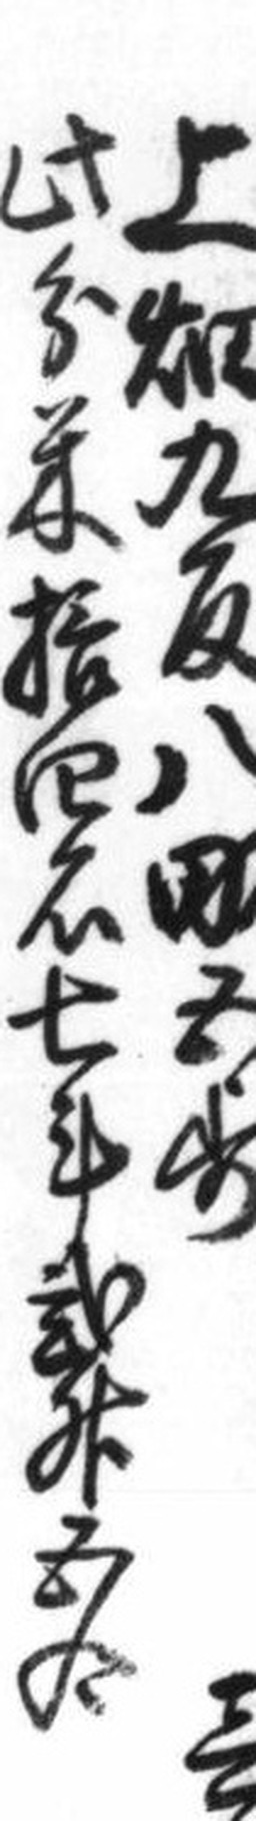此分米拾四石七斗弐升五合
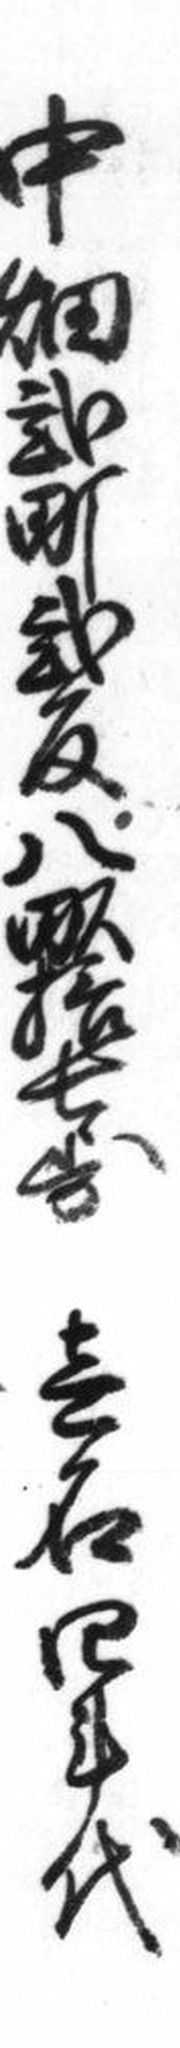中畑弐町弐反八畝拾七歩壱石四斗代
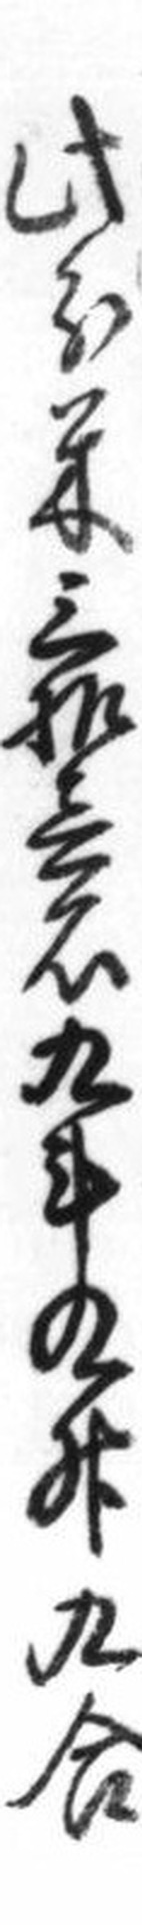此分米三拾壱石九斗九升九合
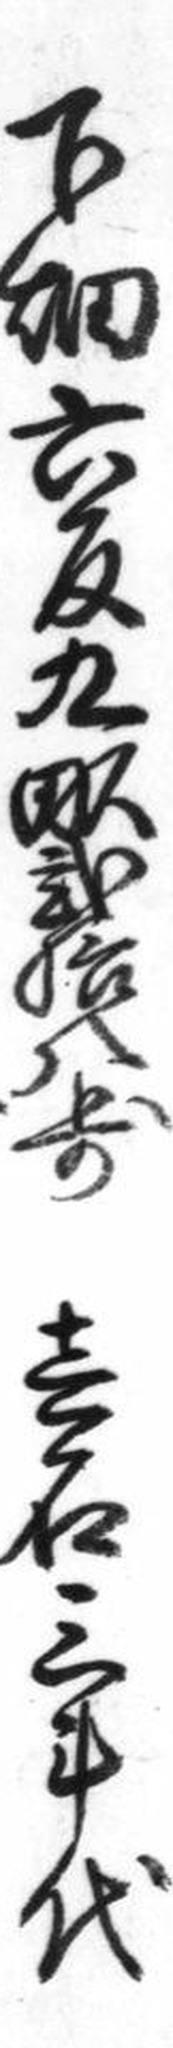下畑六反九畝弐拾八歩壱石三斗代
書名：越前国大野郡今井村明細帳
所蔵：福井県文書館 Fukui Prefectural Archives
